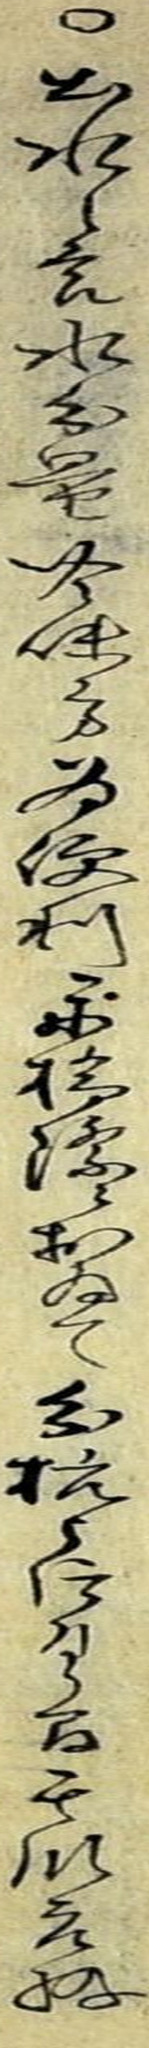〇出水之節水分量吟味方為便利舟橋際ニおゐて分杭被仰付候間其段取扱
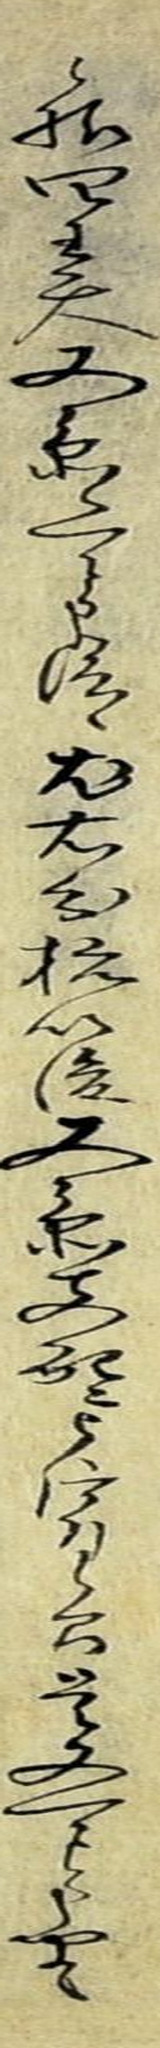候様四王天又兵衛へ可被申渡候尤右分杭以後又兵衛支配ニ被仰付候間是又可被申聞候
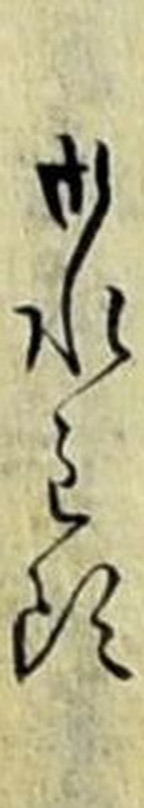御水主頭
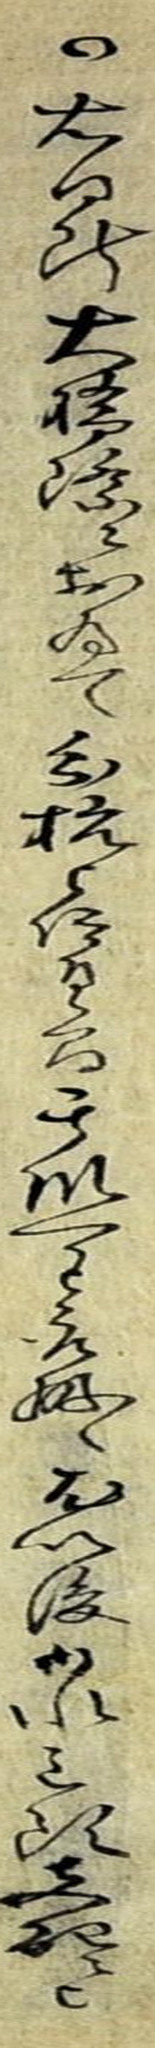〇右同断大橋際ニおゐて分杭被仰付候間其段可被取扱候尤以後御水主頭支配ニ被
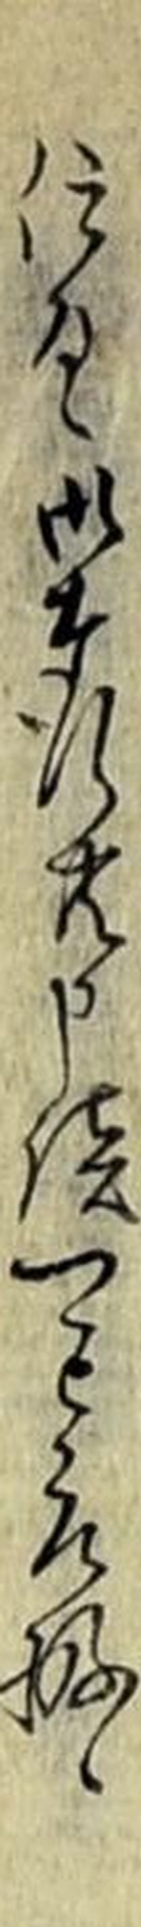仰付候御奉行共申談可被取扱候
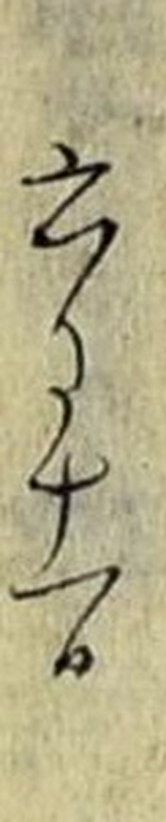六月十一日
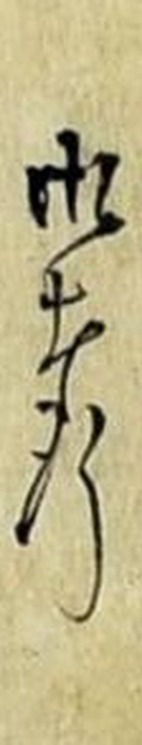御奉行
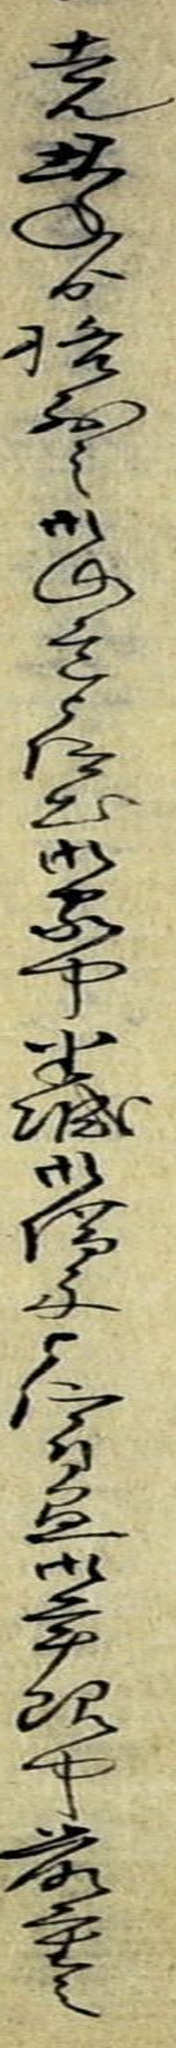〇去ル丑年ゟ格別之御趣意被仰出御家中半減御借米被仰付置御年限中厳重之
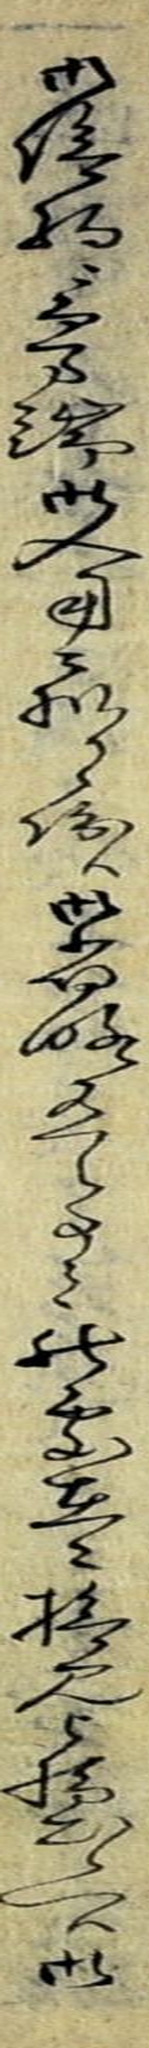御倹約ニ而万端御入用ニ掛り候儀ハ御省略有之事ニ候然処在々検見被指出候ヘハ御
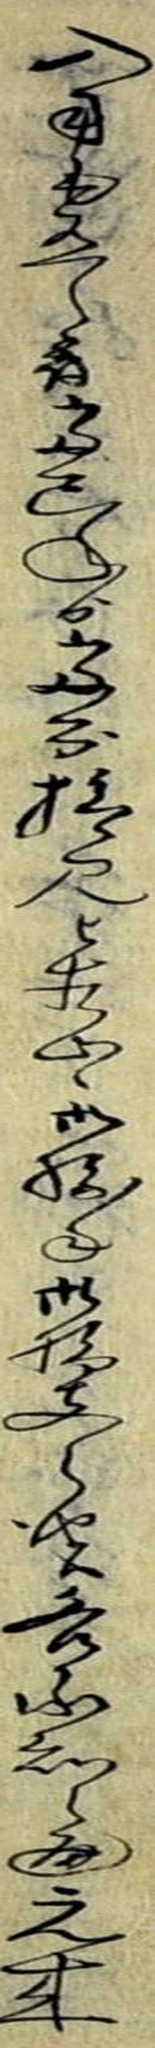入用も有之ニ付当巳年ゟ当分検見被相止候御勝手御指支候儀ハ各承知之通元来
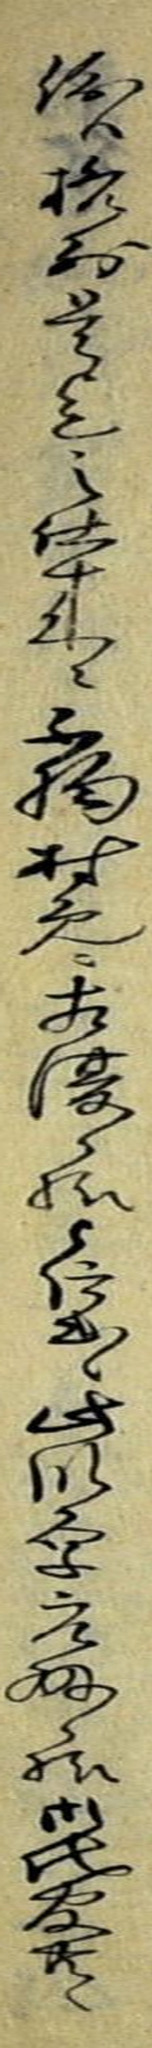儀ハ格別是迄之仕来ニ不拘村免ニ相復候様被仰出候此段厚取扱候様御代官共へ
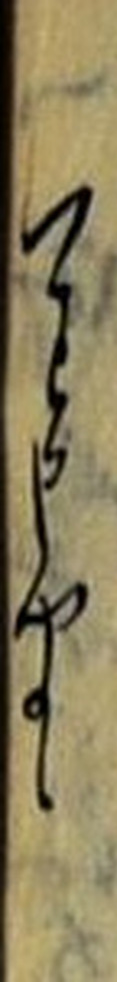可被申聞候
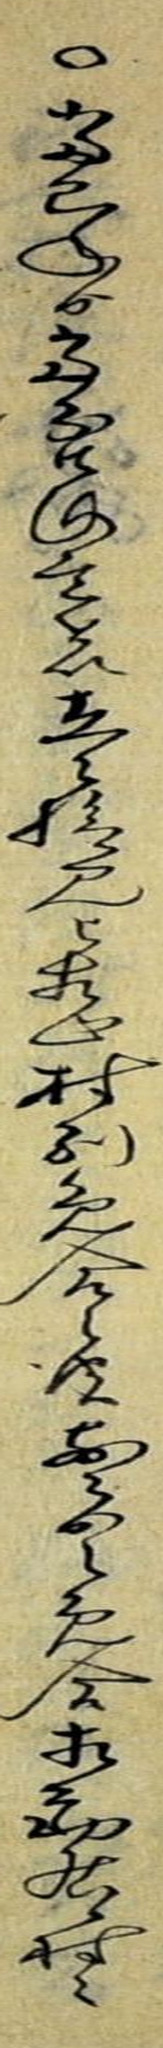〇当巳年ゟ当分御趣意を以在々検見被相止村別免合之儀ハ前々ゟ之免合相勤居候村々
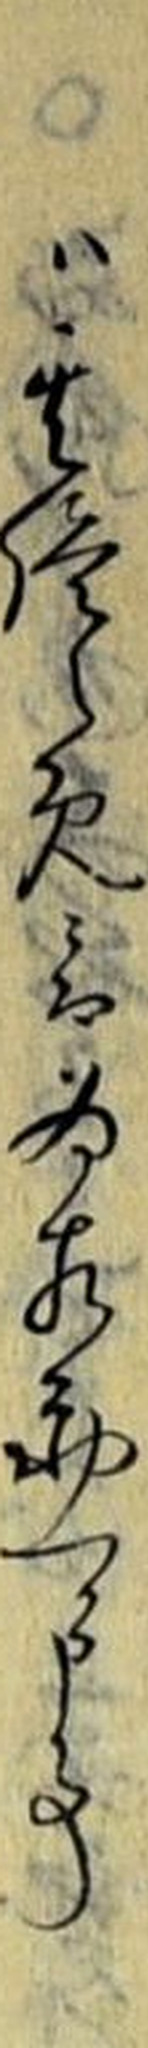ハ其儘之免ニ而為相勤可申事
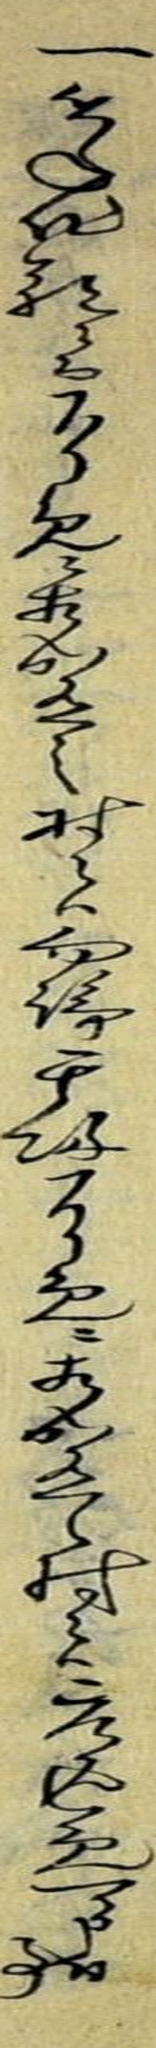一近年作難ニ而下り免ニ相成有之村々ハ勿論其余下り免ニ相成有之村々ハ取返免可申付事
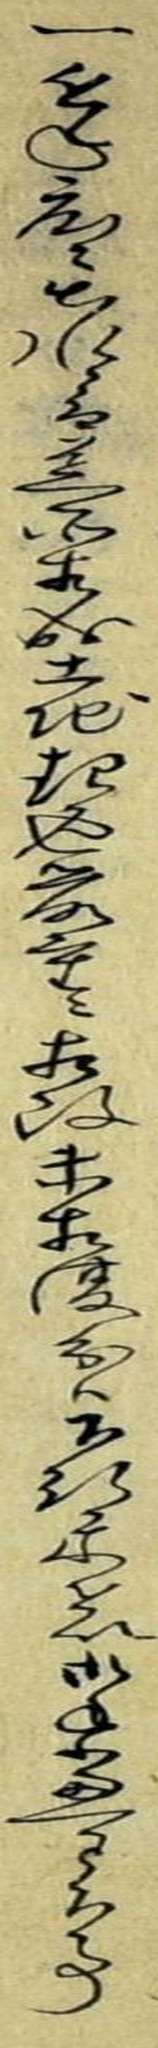一近年度々出水ニ而荒所相成土地起返厳重ニ相改未相復分ハ下行米を以御手当可被下事
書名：命令之部 三
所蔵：福井県文書館 Fukui Prefectural Archives
